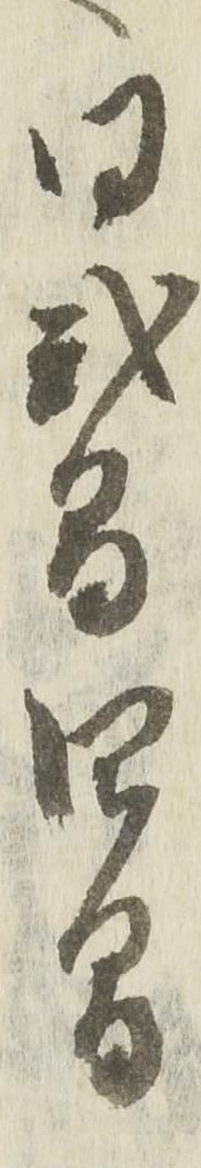同弐間四間
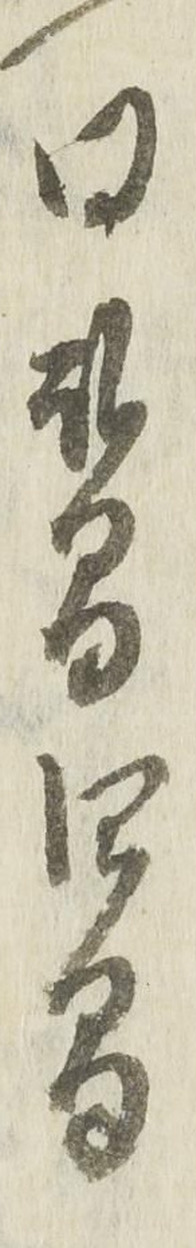同弐間四間
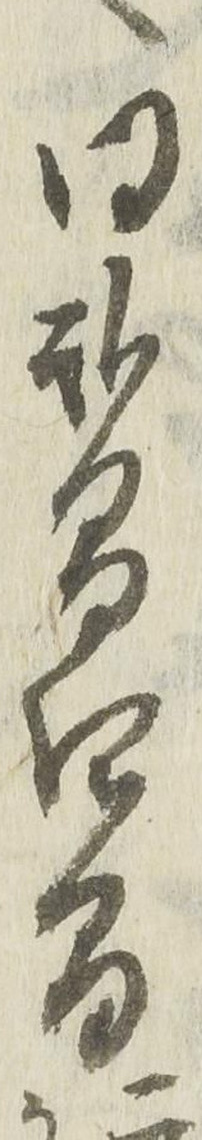同弐間四間
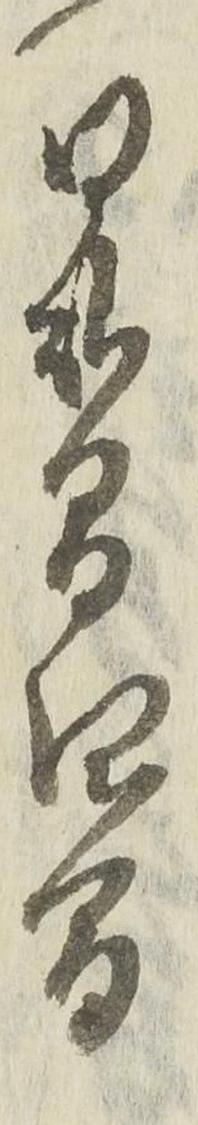同弐間四間
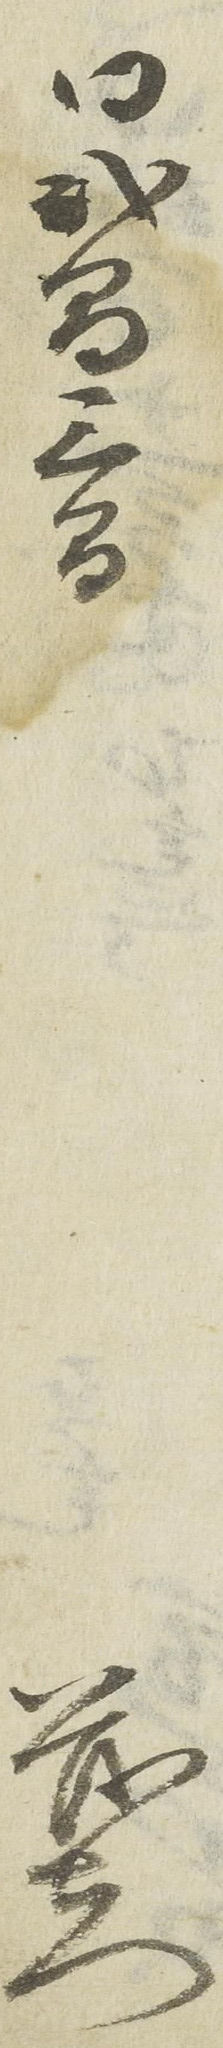同弐間三間藤右衛門
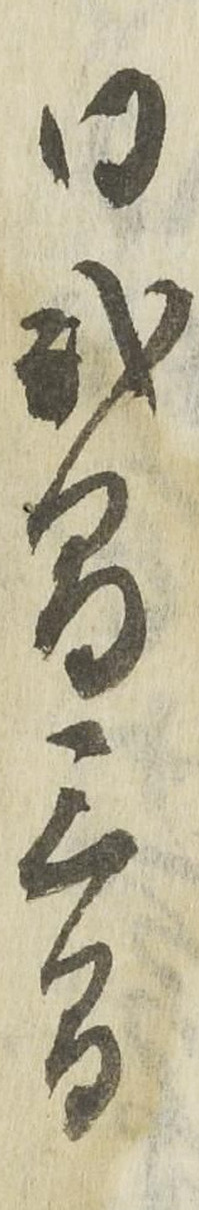同弐間四間

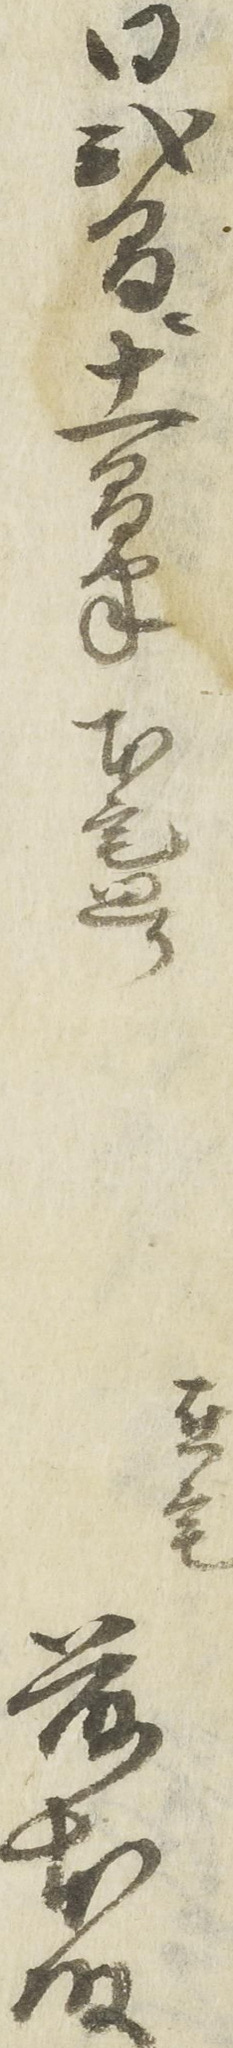同弐間十一間半本宅廻り在宅藤本殿
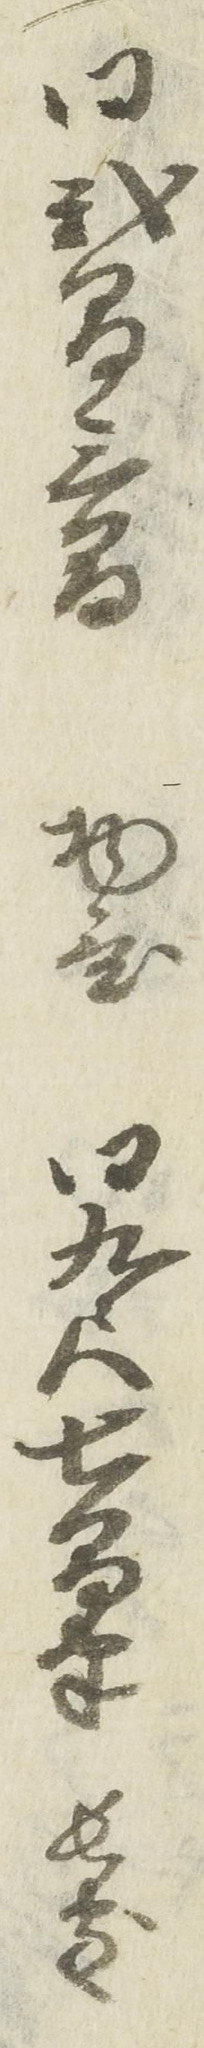同弐間三間物置同九尺三間半長屋
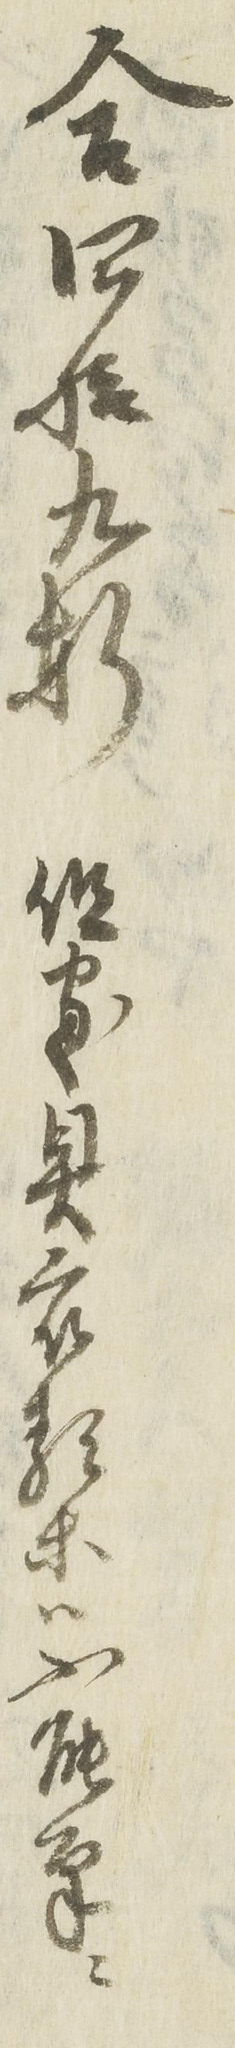合四拾九軒但家具衣類等ハ不能更ニ
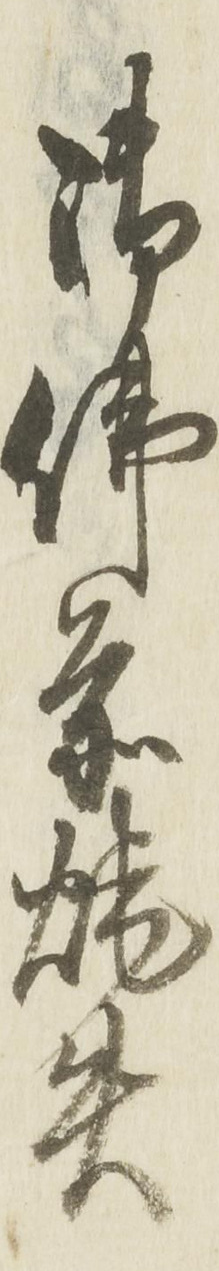御仏前焼失
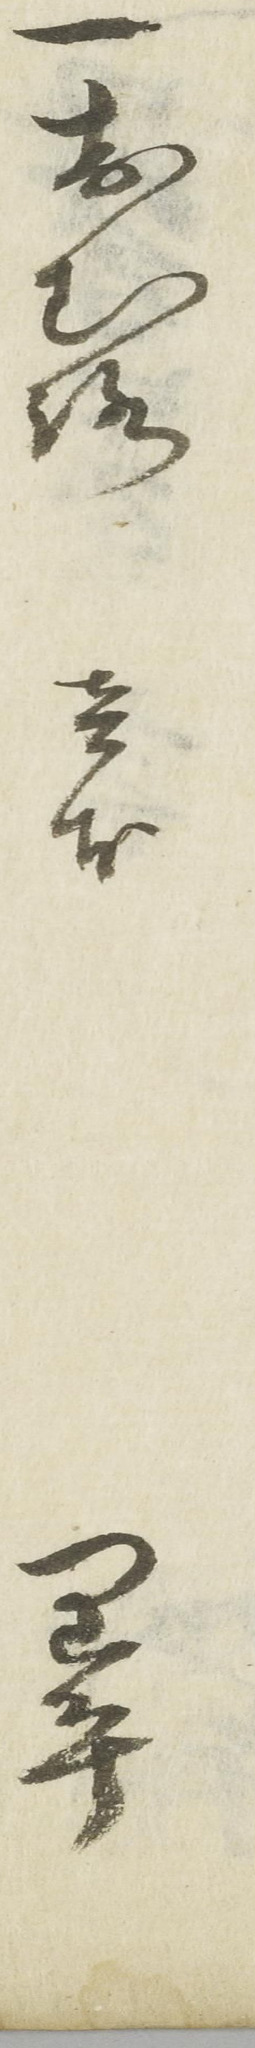一お花洛壱本里平
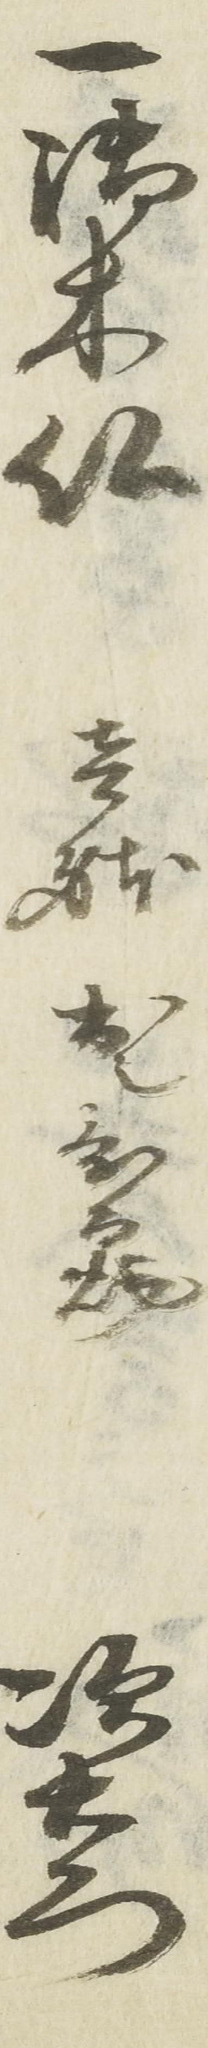一御木仏壱躰出し置而焼次右衛門
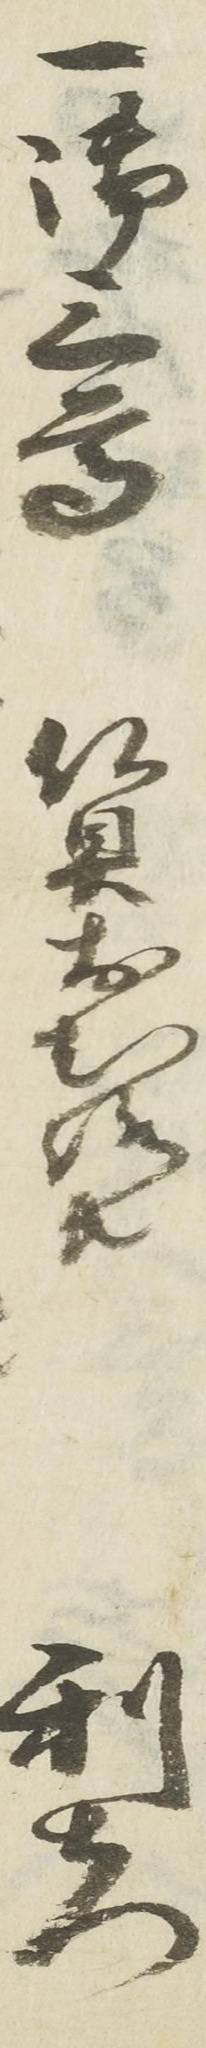一御三尊仏具お花洛共利右衛門
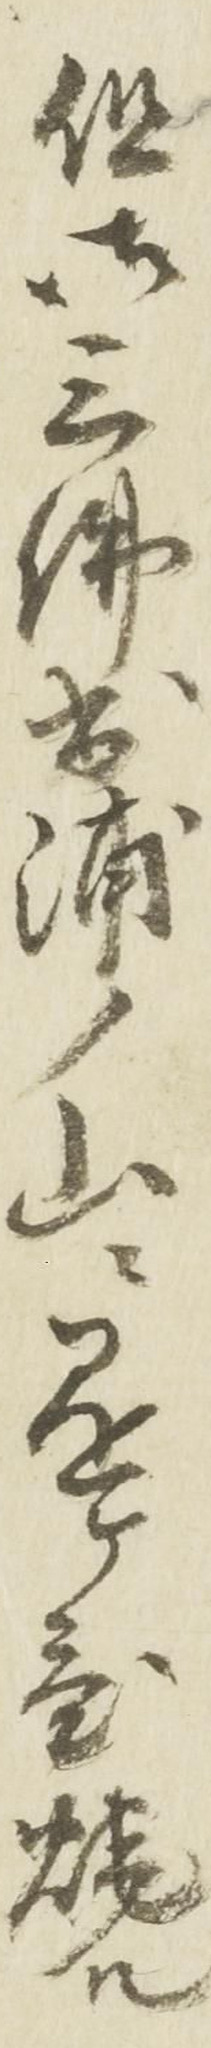但御三仏出浦ノ山ニ懸ケ置焼ル
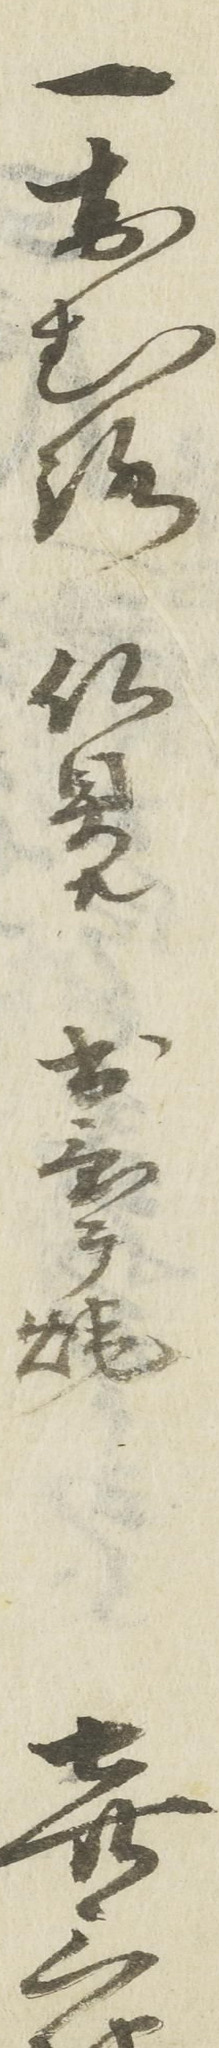一お花洛仏具共出置ヲ焼喜三次
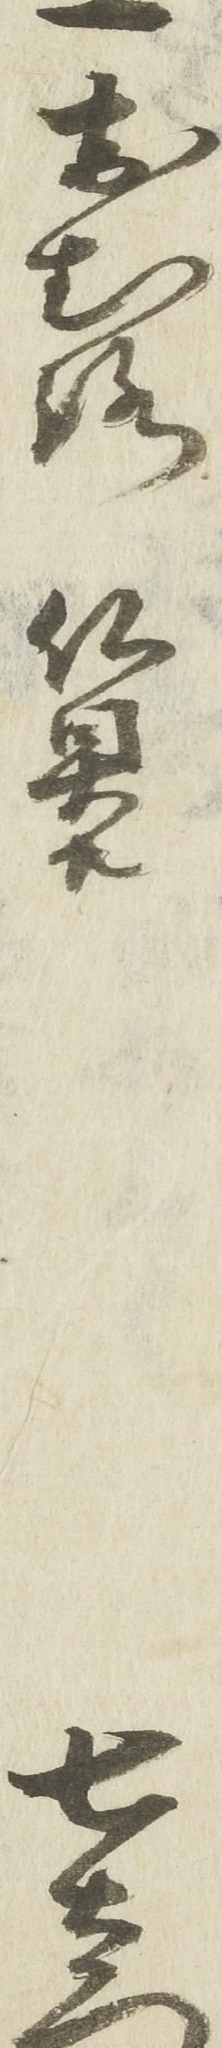一お花洛仏具共七右衛門
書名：後見笑
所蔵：東京大学地震研究所図書室 Earthquake Research Institute Library, The University of Tokyo, JAPAN
